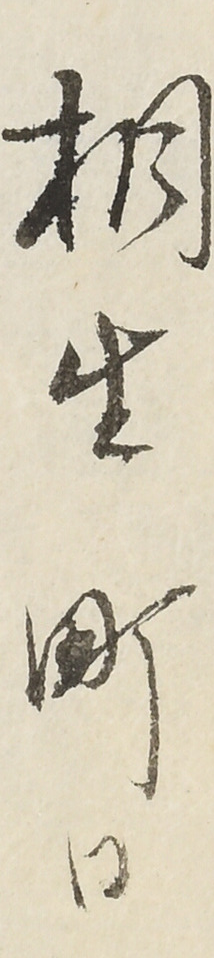相生町同
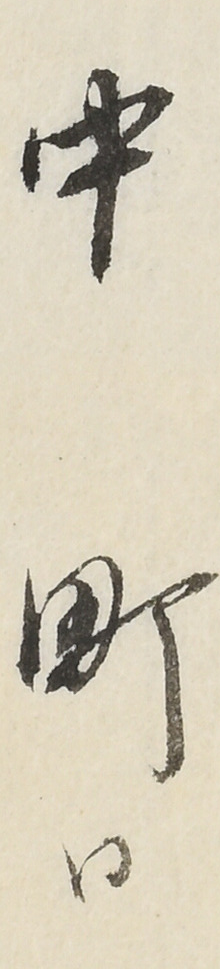中町同
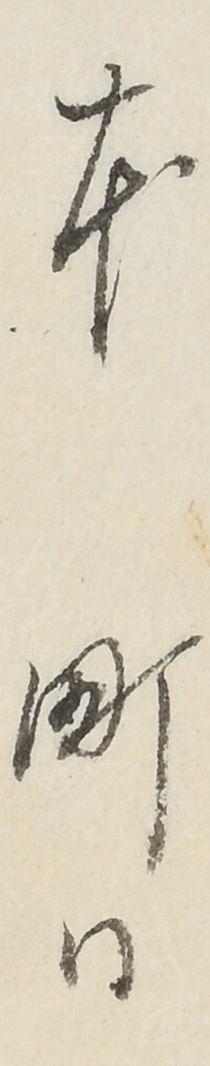本町同

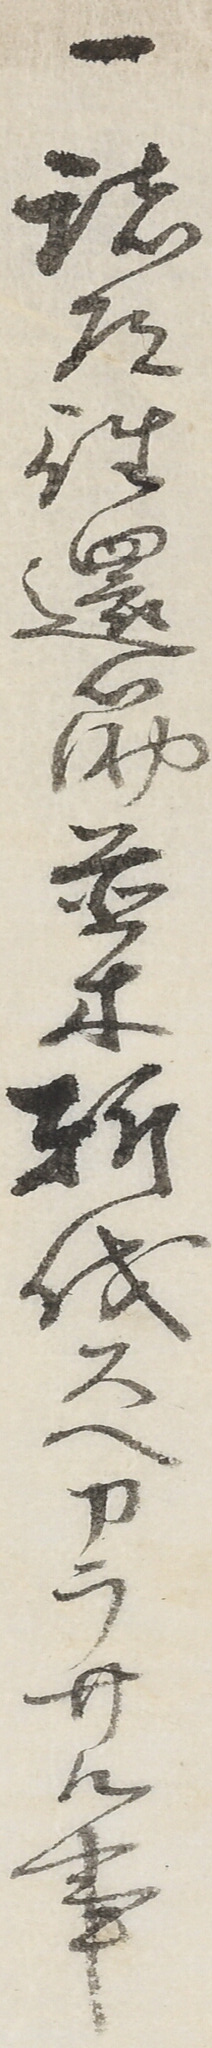一諸道往還筋並木斬伐スヘカラサル事
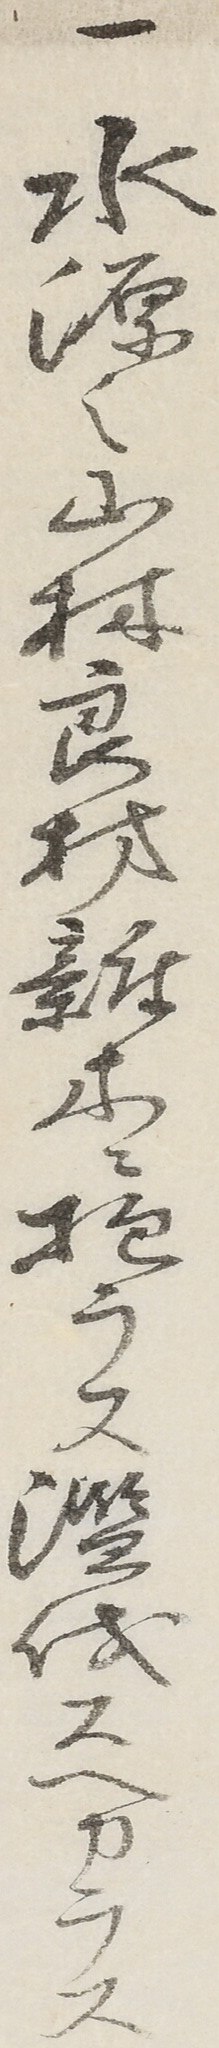一水源之山林良材雑木ニ拘ラス濫伐スヘカラス
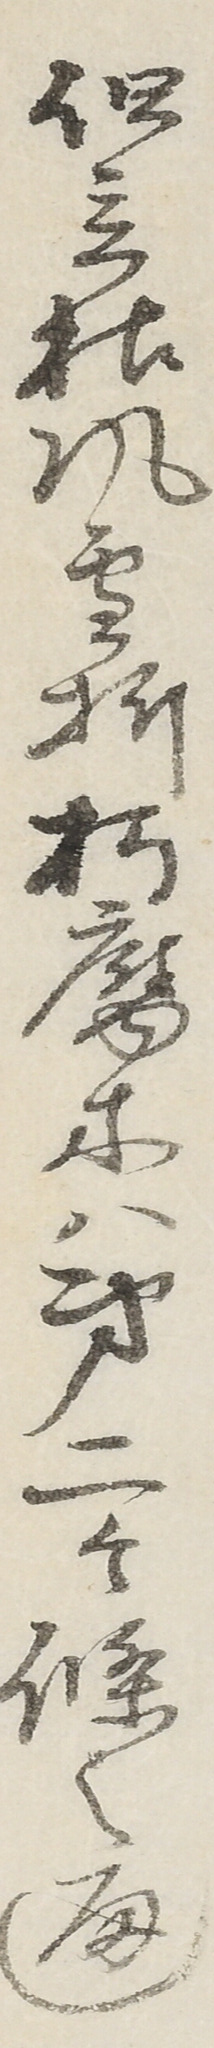但立一枯風雪折朽腐木ハ第二ヶ條之通
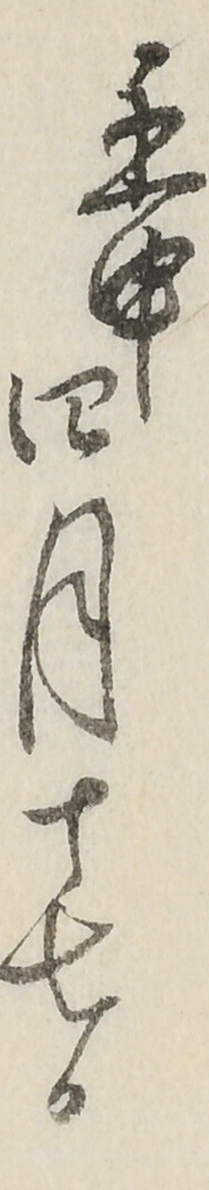壬申四月十七日
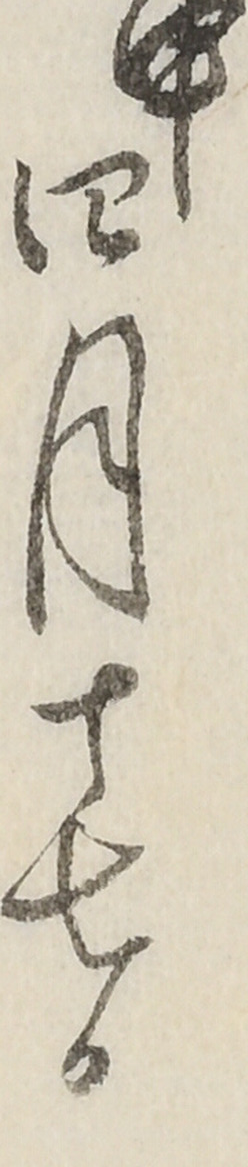壬申四月十七日
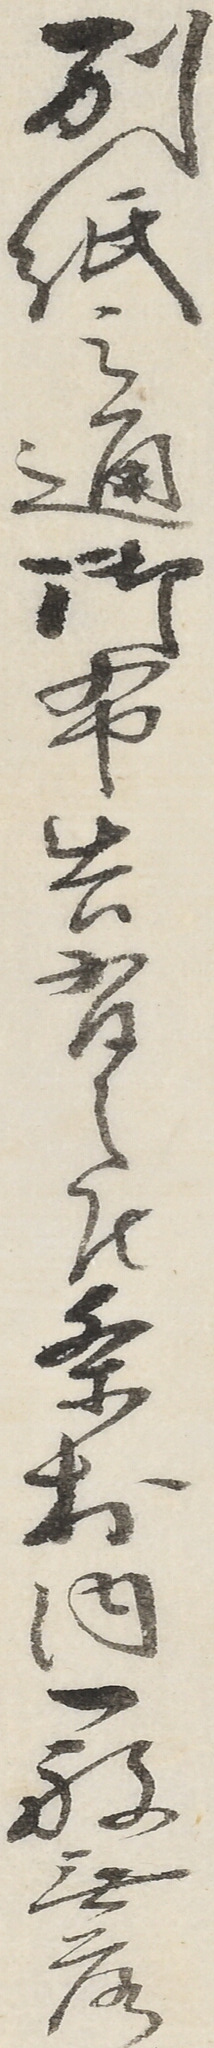別紙之通仰出希告有之候条村内一般無落
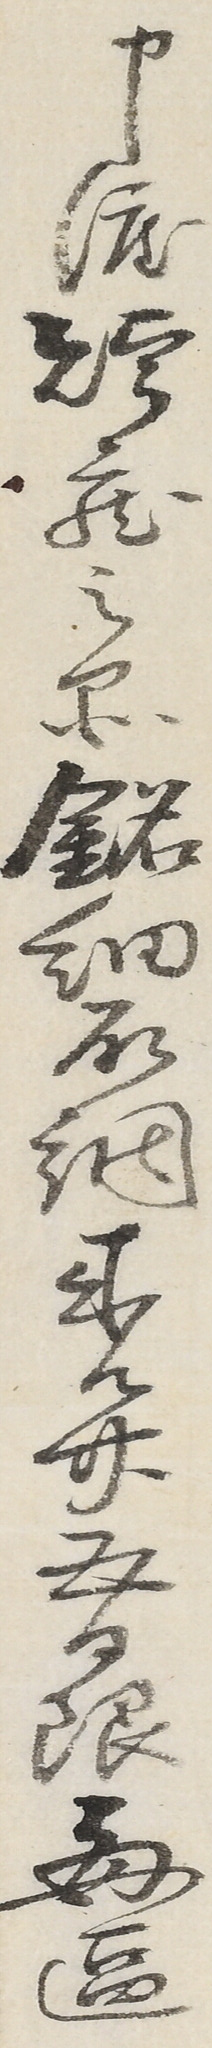申渡貯蔵之品銘細取調来ル廿五日限再区
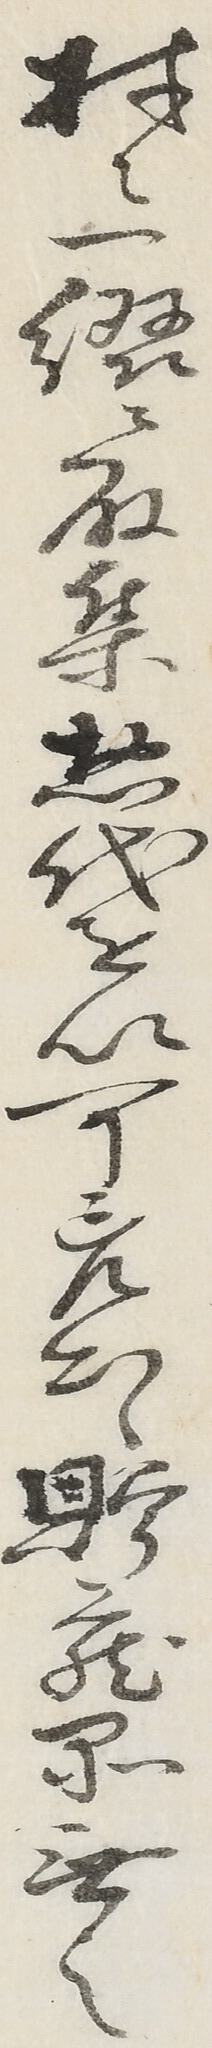村々一綴ニ取集惣代を以可左出候貯蔵品無之
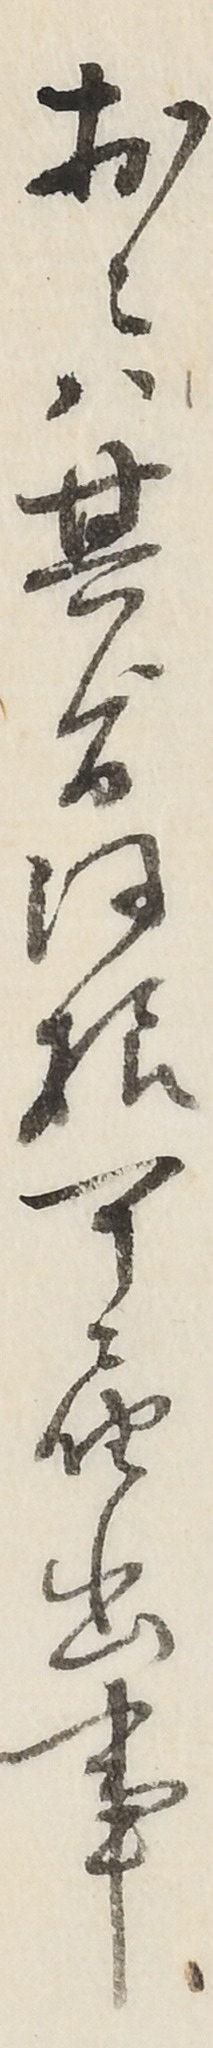村々ハ其ゟ同様可届出事
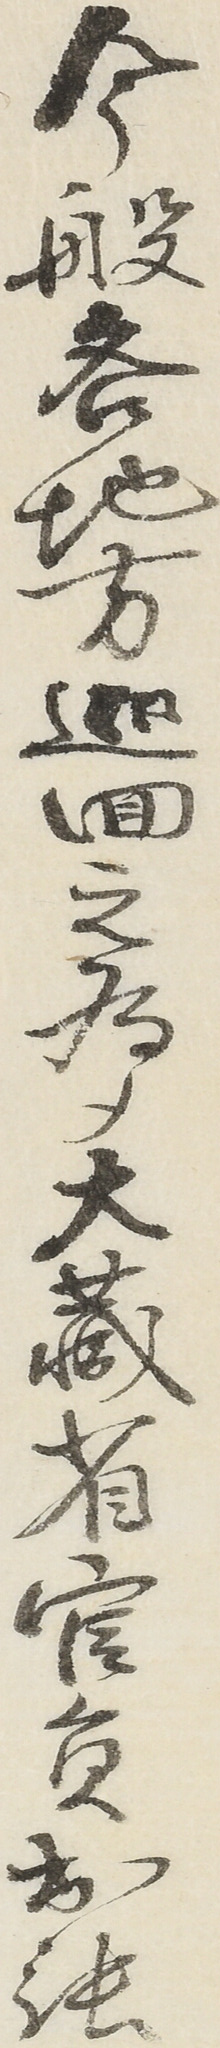今般各地方巡回之為メ大蔵省官員出張
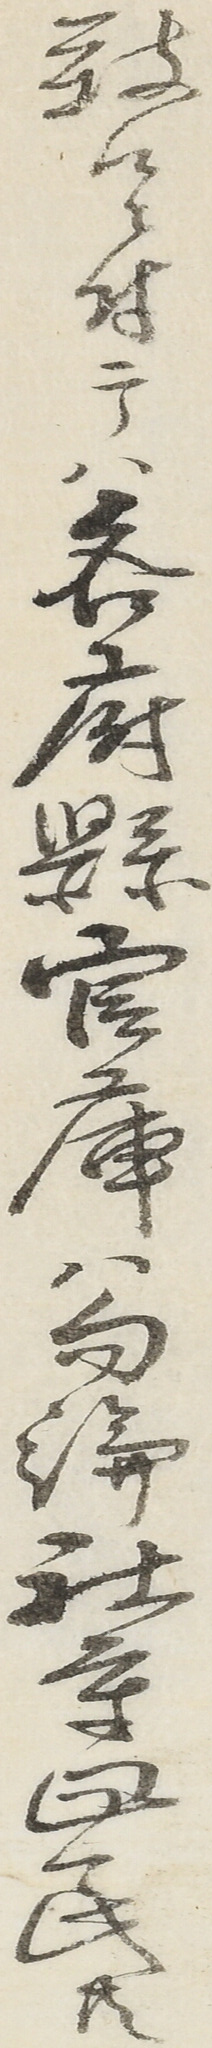致候ニ付テハ各府県官庫ハ勿論社寺山民共
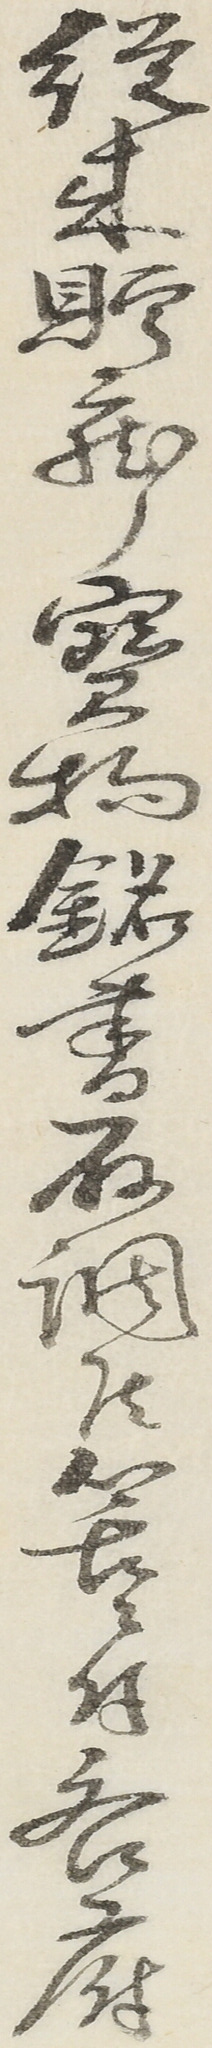従来貯蔵ノ宝物銘書取調候筈ニ付各府
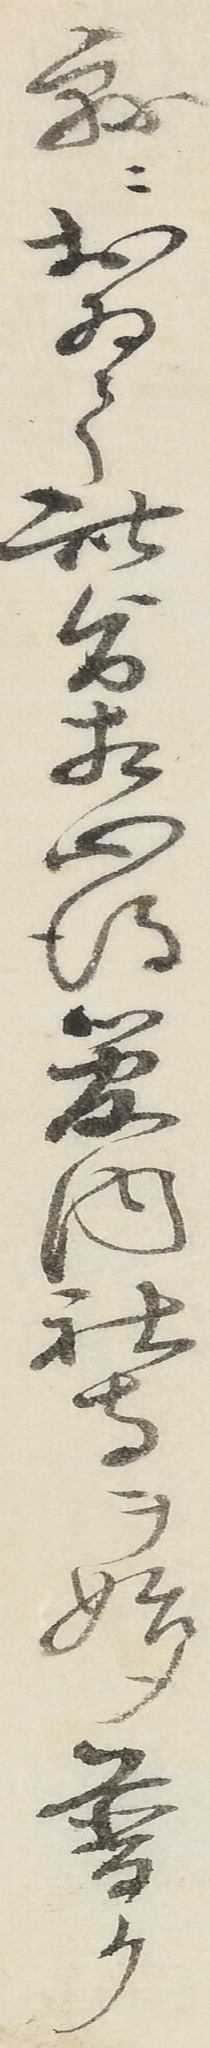県ニおゐて此旨相心得管内社寺ヲ始メ普ク
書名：廻状（控）
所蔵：伊那市立高遠町図書館・合同会社AMANE
